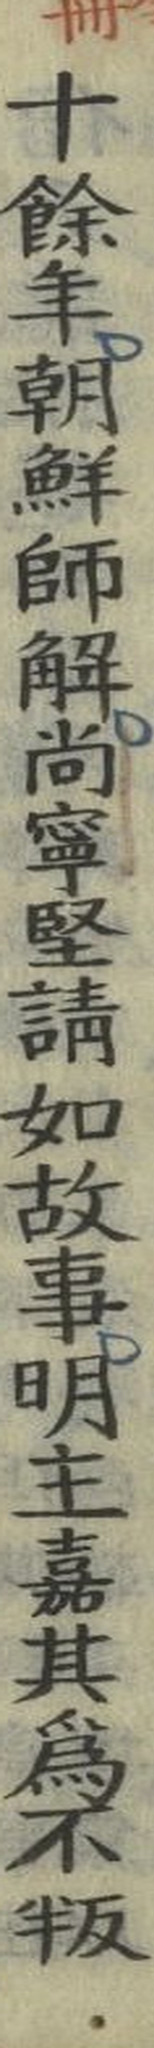十餘年。朝鮮師解。尚寧堅請如故事。明主嘉其爲不叛
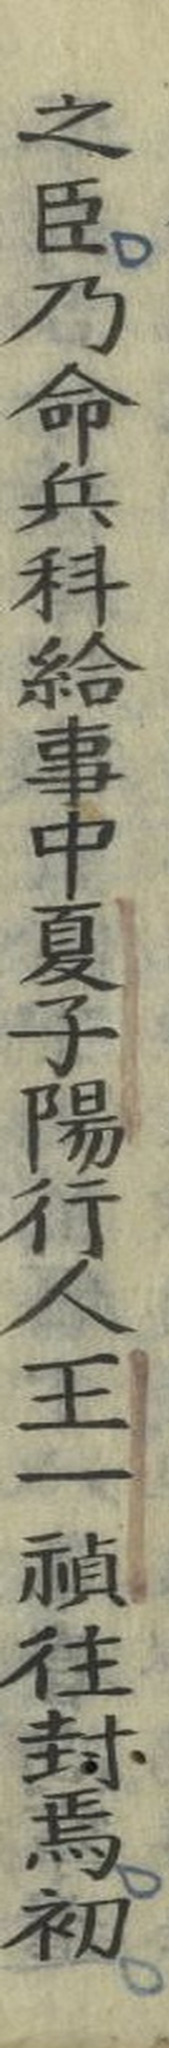之臣。乃命兵科給事中夏子陽行人王一禎往封焉。初。
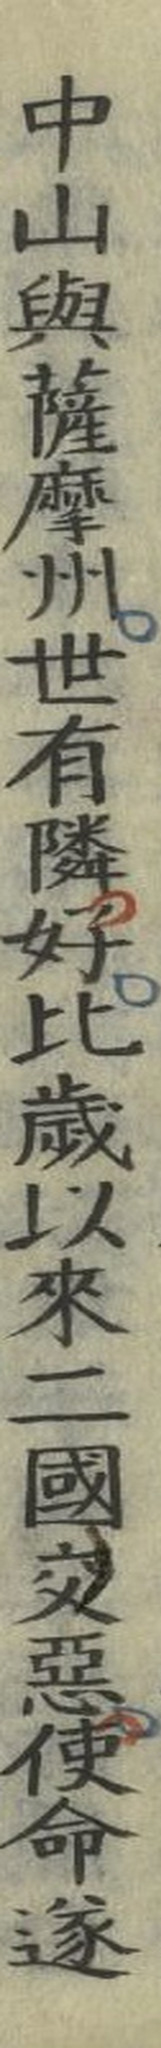中山與薩摩州。世有隣好。此歲以來二國交惡。使
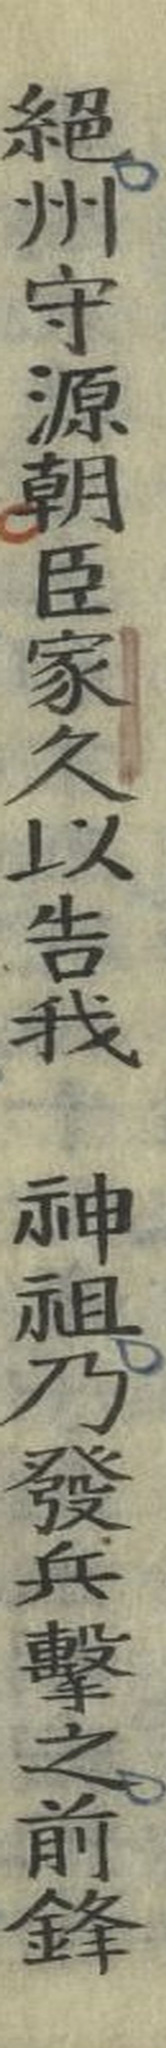絕。州守源朝臣家久以告我神祖。乃發兵擊之。前鋒
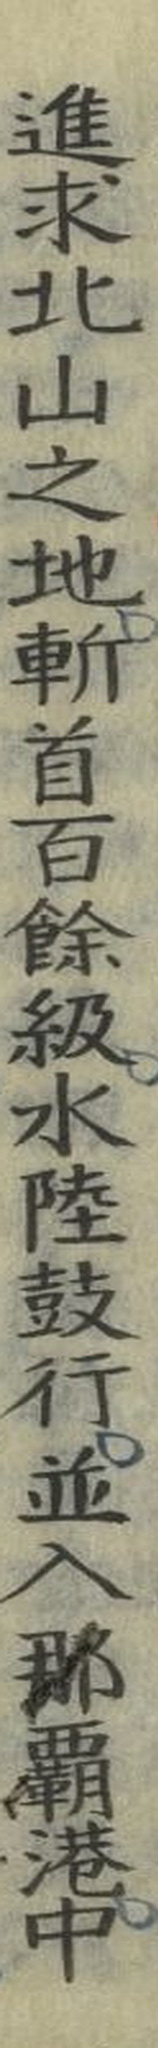進求北山之地。斬首百餘級。水陸鼓行。並入那覇
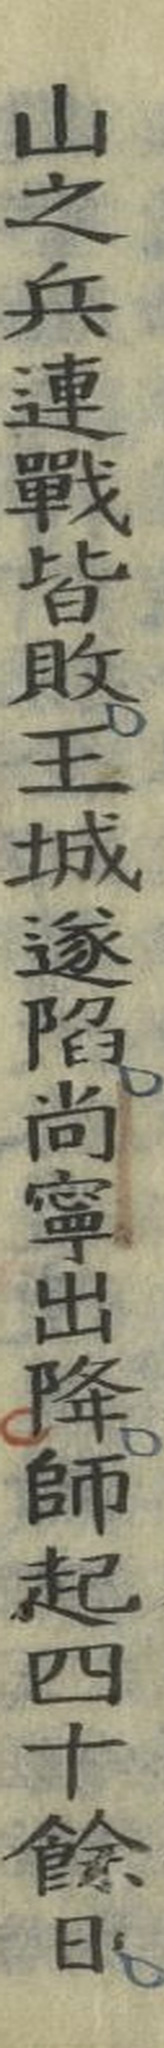山之兵連戰皆敗。王城遂陷。尚寧出降。師起四十餘日。
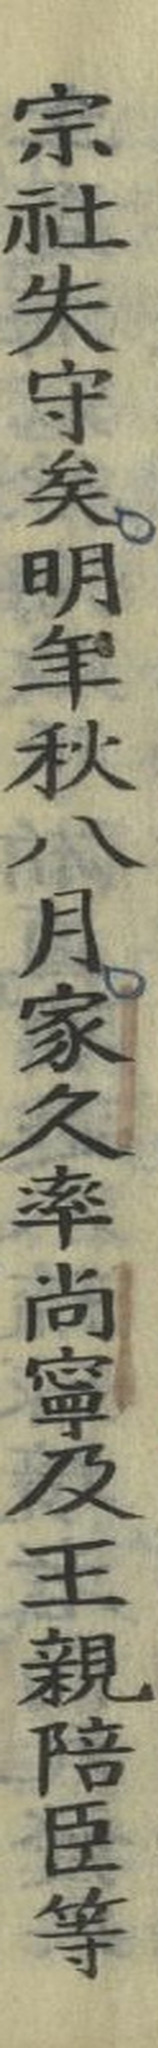宗社失守矣。明年秋八月。家久率尚寧及王親陪臣等
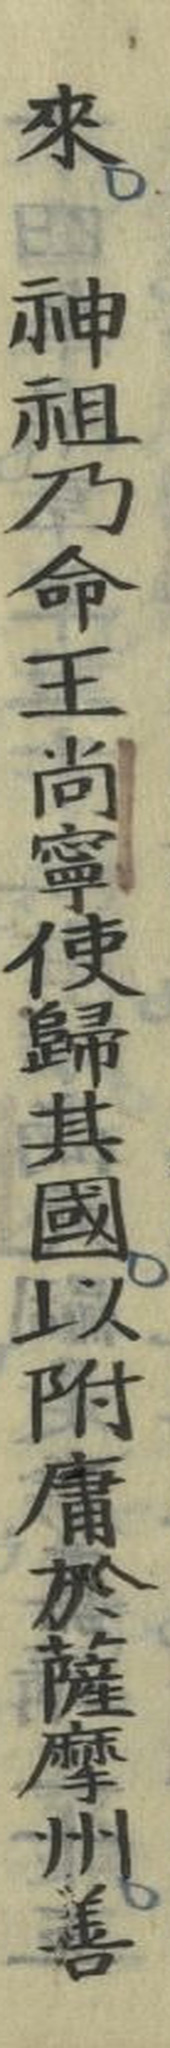來。神祖乃命王尚寧使歸其國。以附庸於薩摩
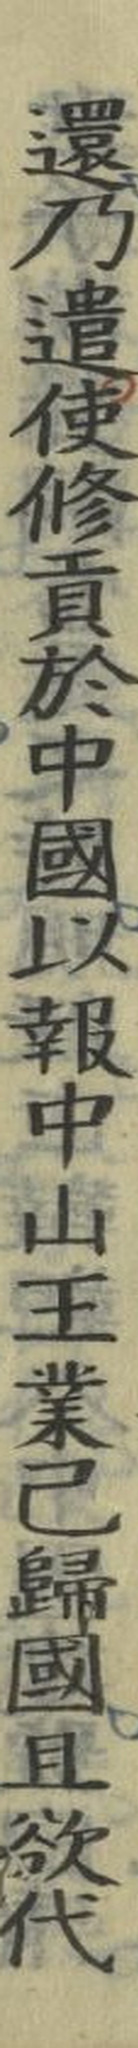還。乃遣使修貢於中國。以報中山王業己歸國。且欲代
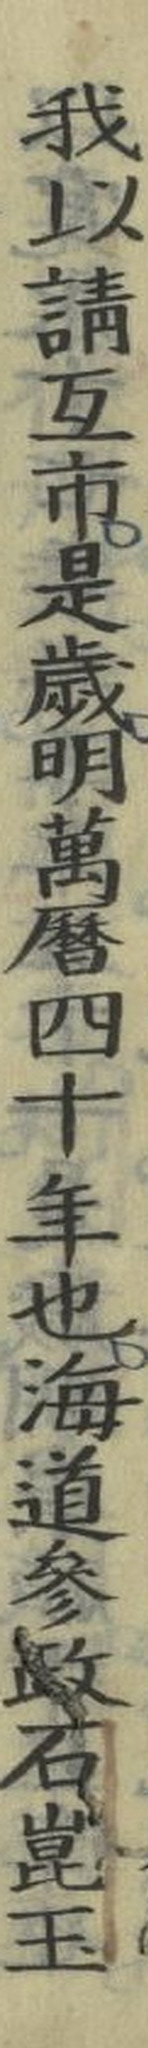我以請互市。是歲。明萬曆四十年也。海道參政石崑
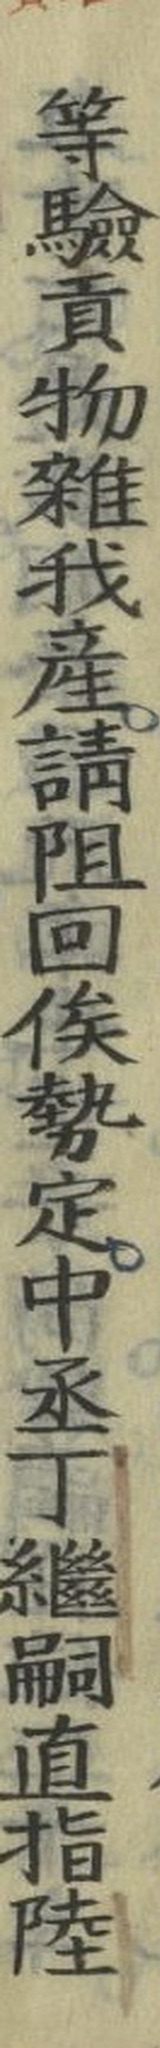等驗貢物雜我産。請阻回俟勢定。中丞丁繼嗣直指
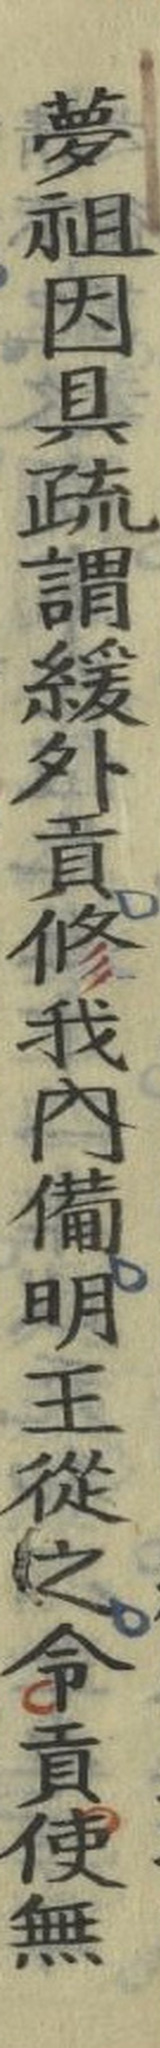夢祖因具疏謂緩外貢。修我内僃。明主從之。令貢使

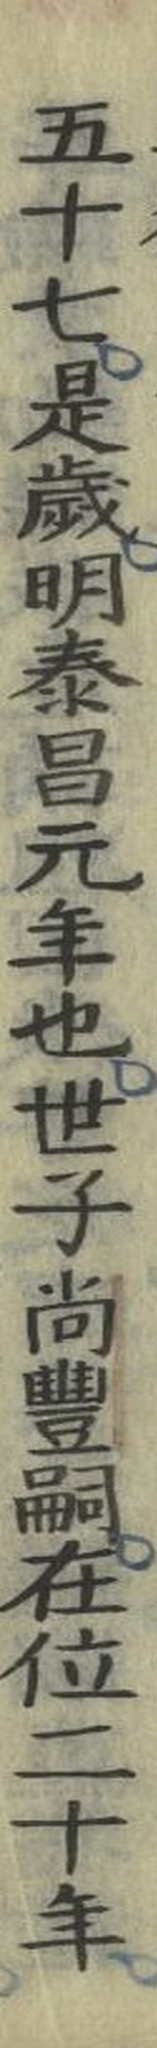五十七。是歲。明泰昌元年也。世子尚豐嗣。在位二十年。
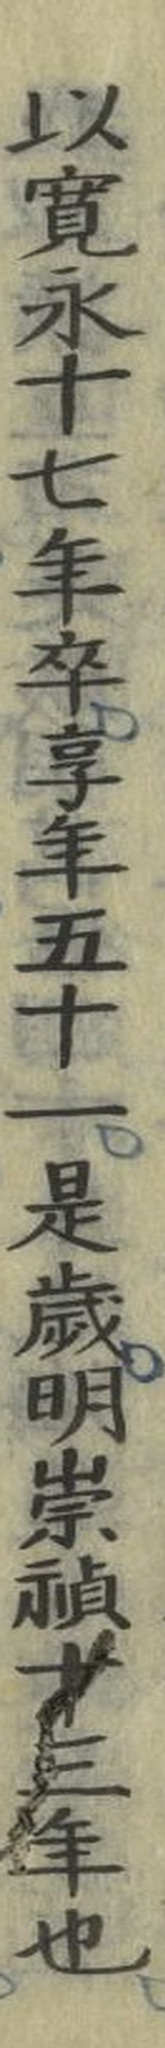以寛永十七年卒。享年五十一。是歲。明崇禎十三年
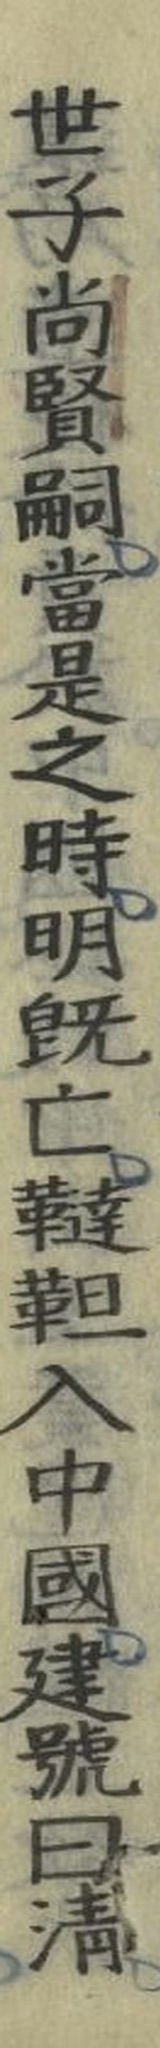世子尚賢嗣。當是之時。明既亡。韃靼入中國。建號曰淸。
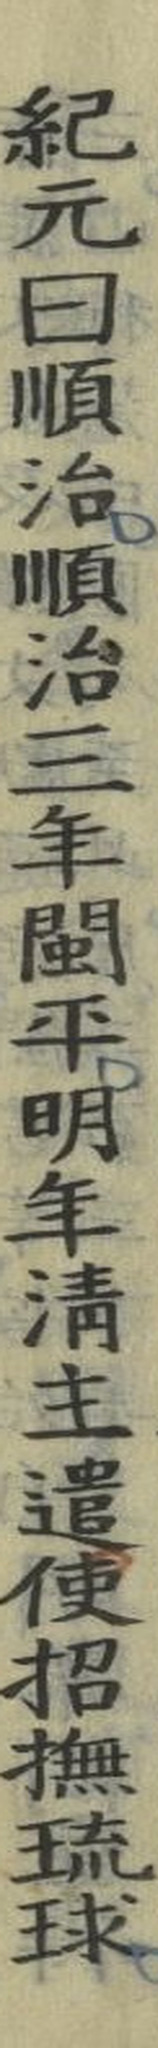紀元曰順治。順治三年閩平。明年淸主遣使招撫琉
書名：南島志
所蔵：University of the Ryukyus Library
